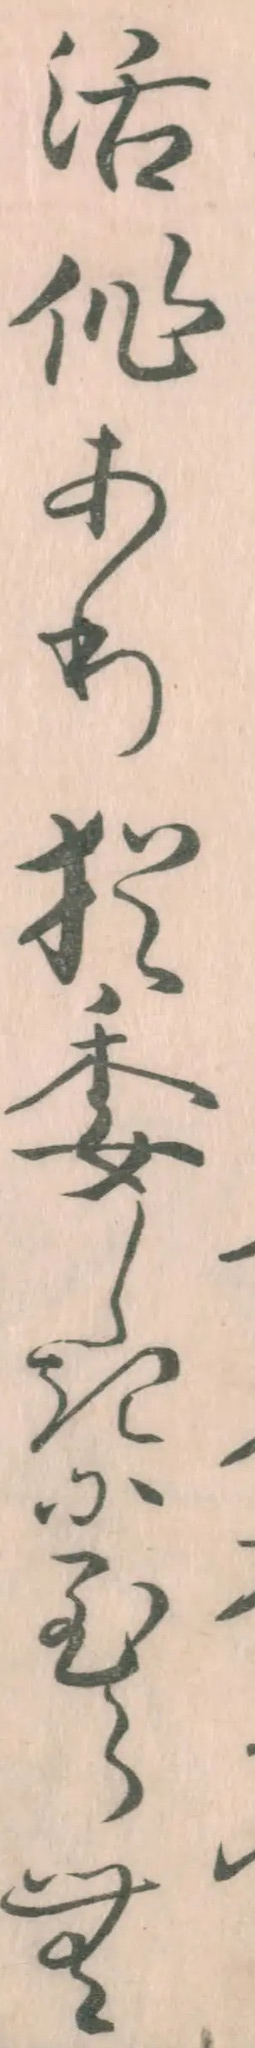活俳あり猶委しきに至らむ
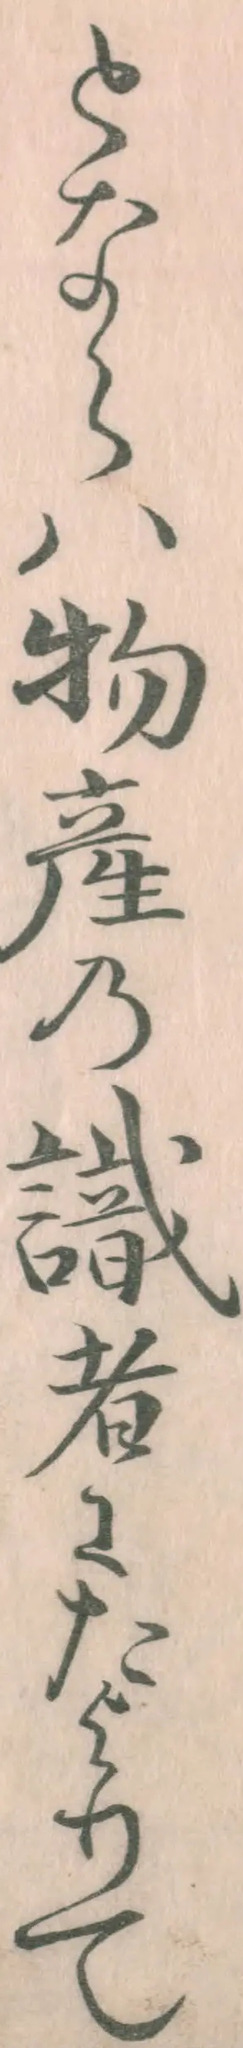とならは物産の識者にたよりて
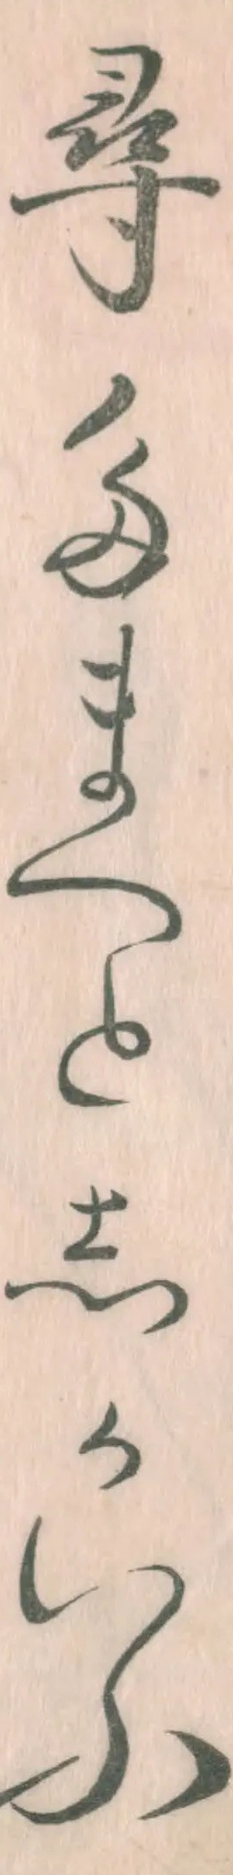尋たまへとしかいふ
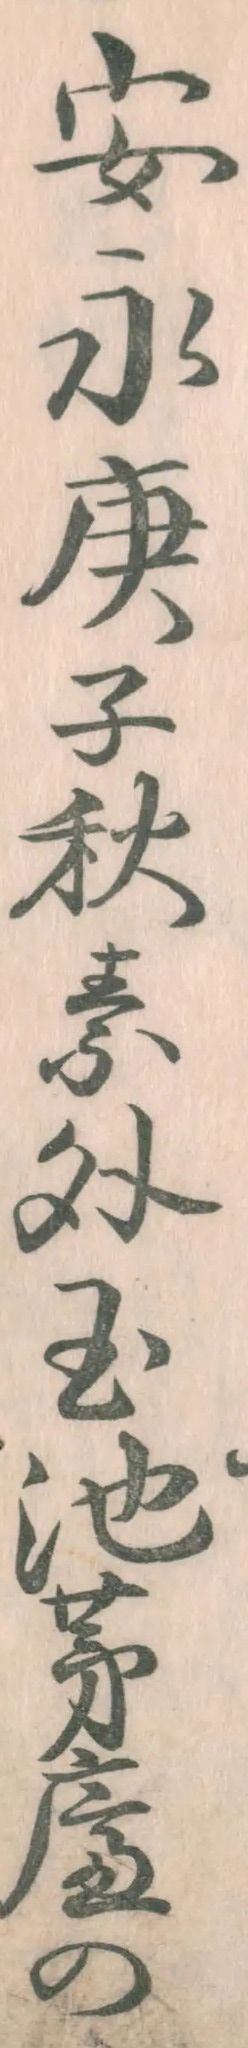安永庚子秋素外玉池茅處の
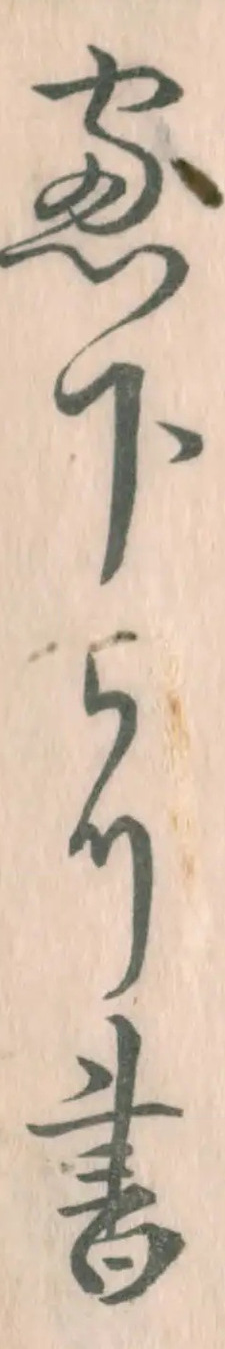恵下より書

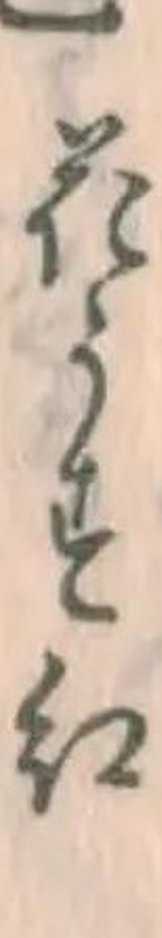花うす紅
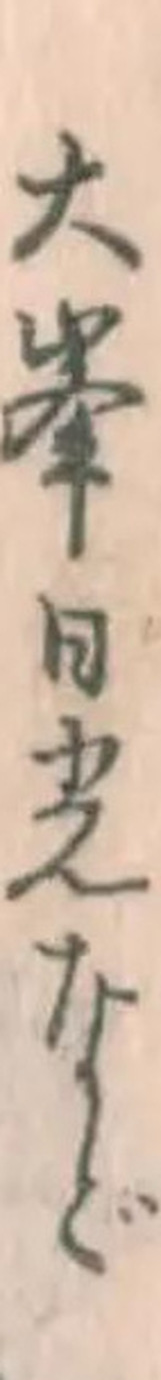大峰日光など
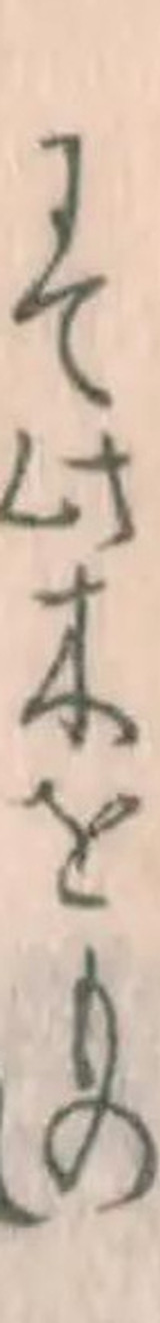して此本をもの
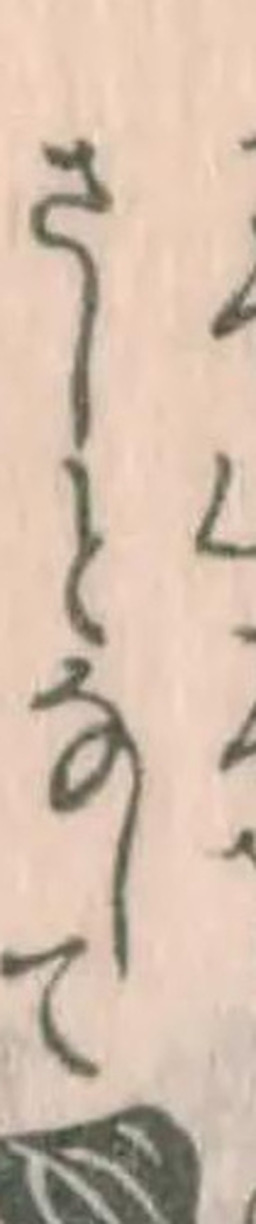さしとなして
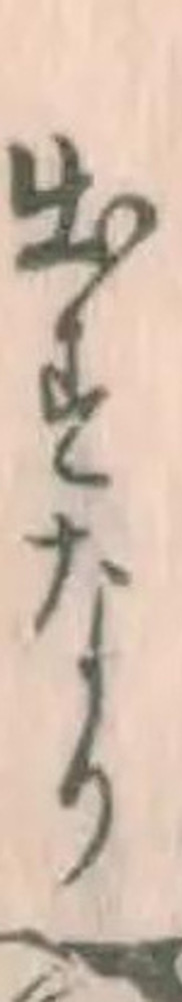出すなり
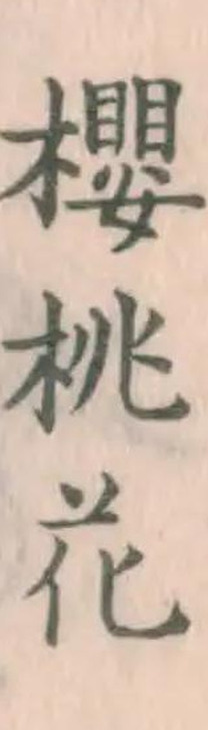桜桃花
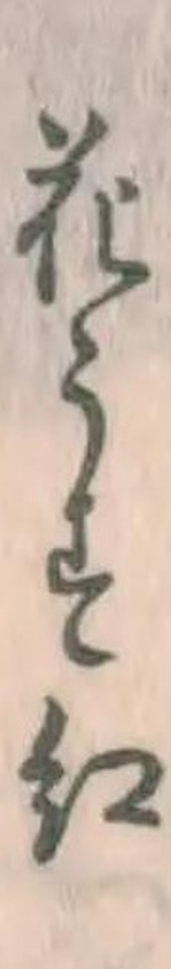花うす紅
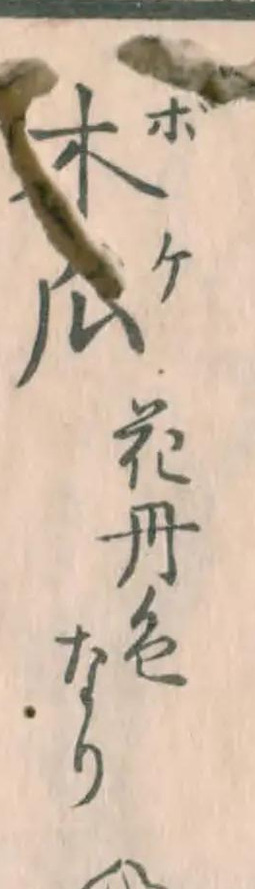木瓜花丹色なり

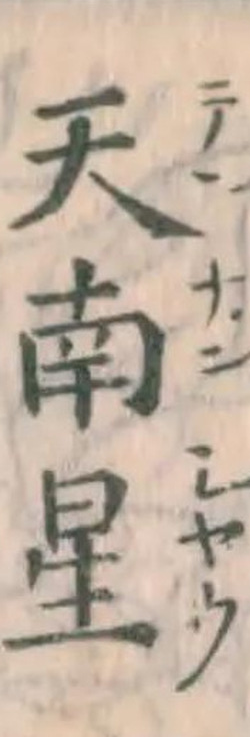天南星
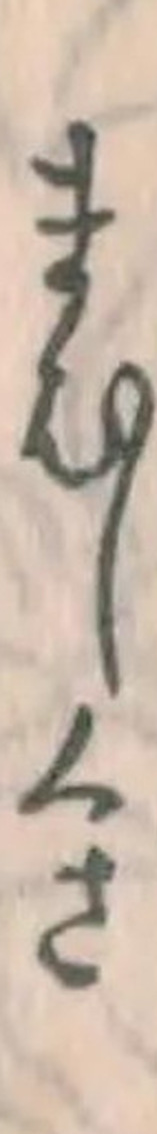まむしくさ
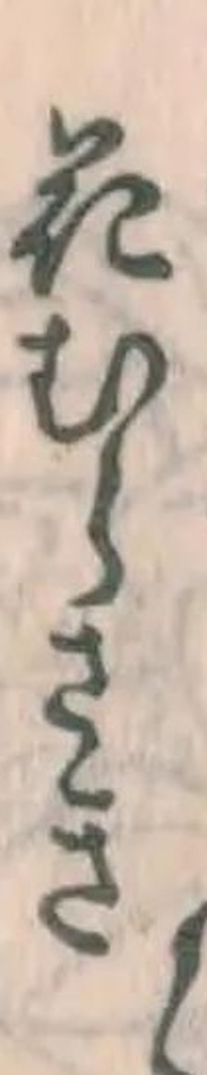花むらさき
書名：誹諧名知折 2巻. [1]
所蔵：国立国会図書館 National Diet Library, JAPAN
